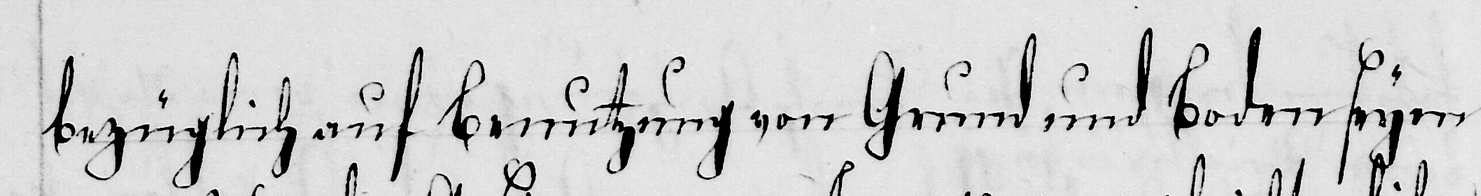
bezüglich auf Benutzung von Grund und Boden seyen
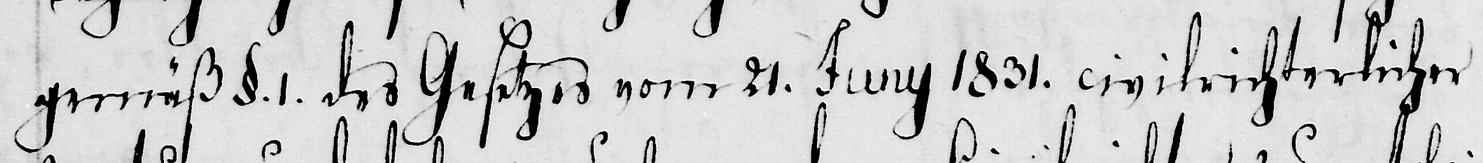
gemäß §. 1. des Gesetzes vom 21. Juny 1831. civilrichterlicher
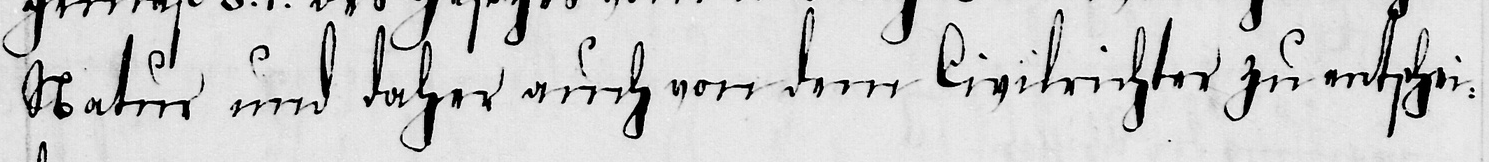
Natur und daher auch von dem Civilrichter zu entsche¬
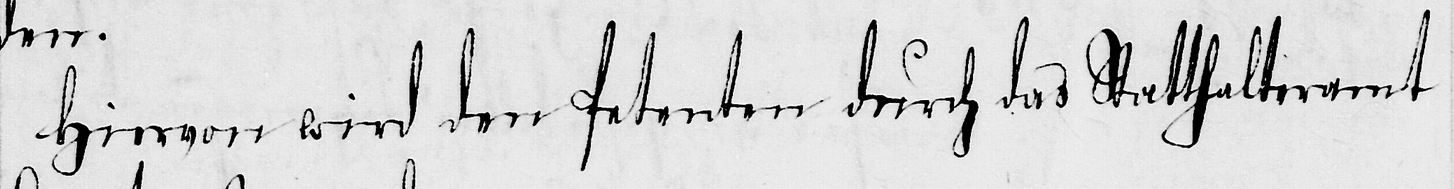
Hiervon wird den Petenten durch das Statthalteramt
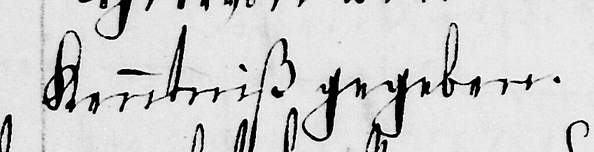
Kenntniß gegeben.
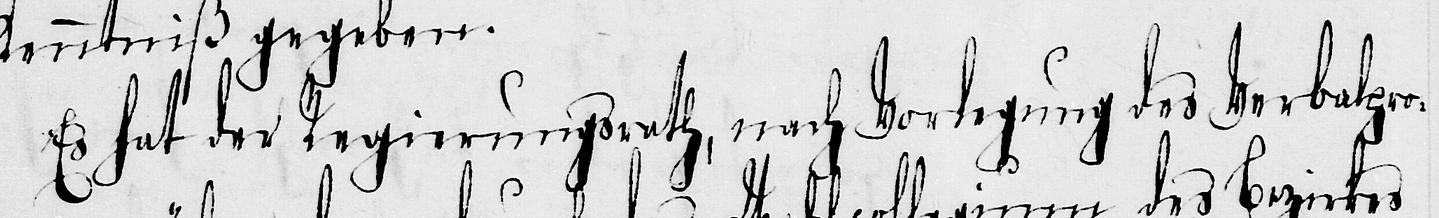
Es hat der Regierungsrath, nach Vorlegung des Verbalpr¬
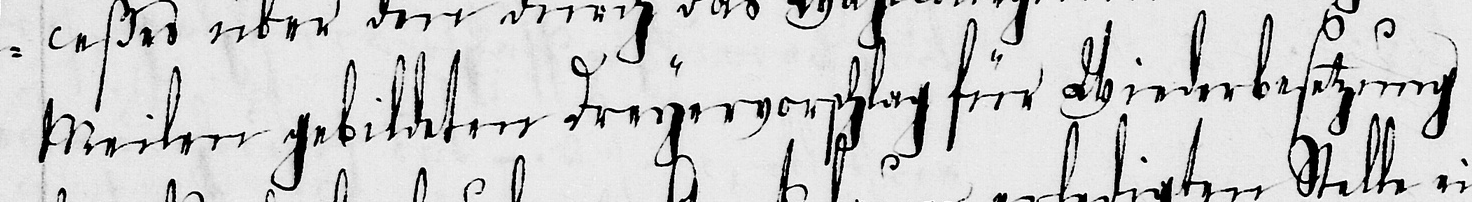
Meilen gebildeten Dreyervorschlag für Wiederbesetzung
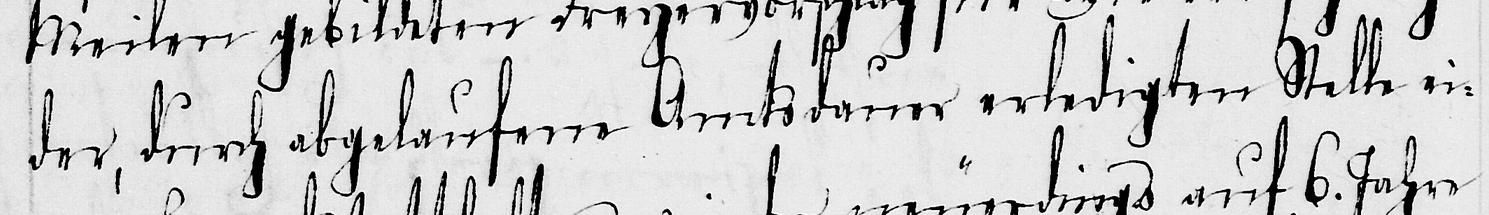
der, durch abgelaufene Amtsdauer erledigten Stelle
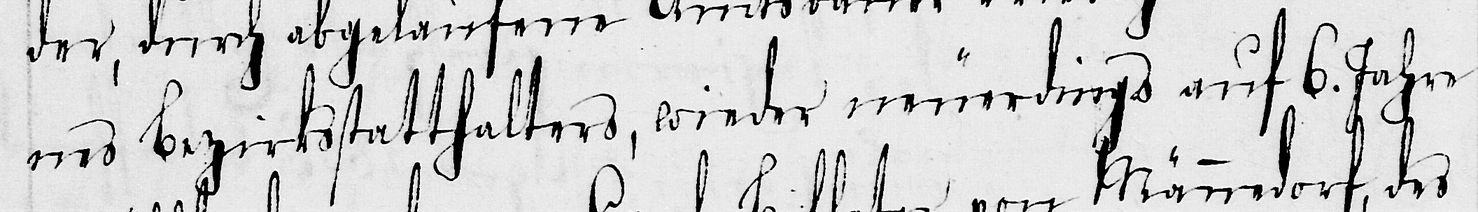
eines Bezirksstatthalters, wieder neuerdings auf 6. Jahre
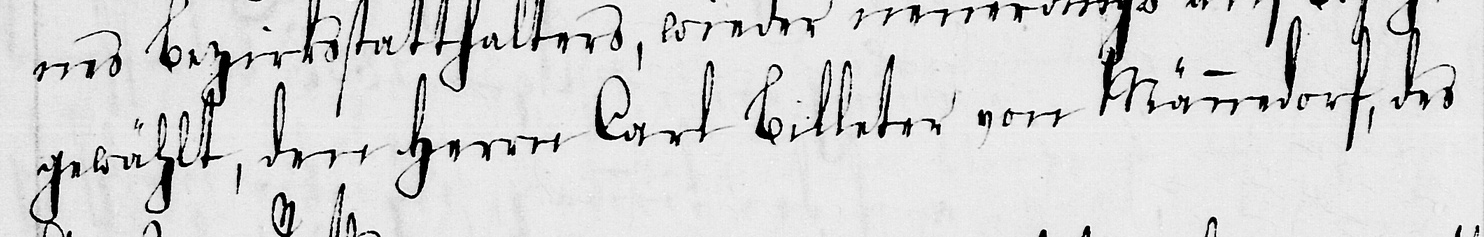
gewählt, den Herrn Carl Billeter von Männedorf, des
